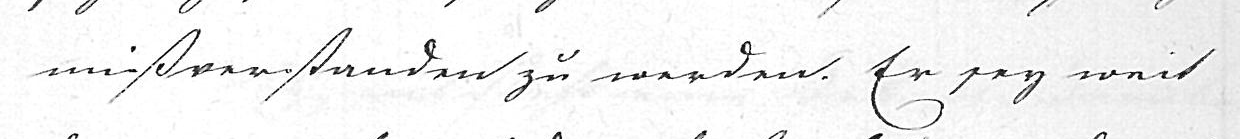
mißverstanden zu werden. Er sey weit
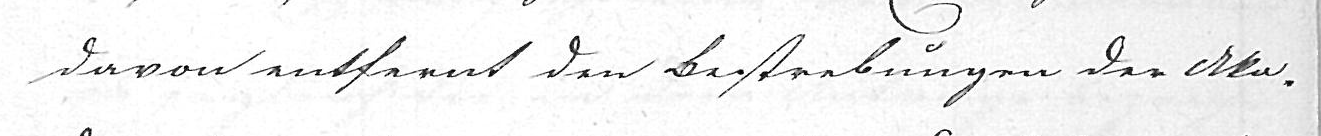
davon entfernt den Bestrebungen der Aka-
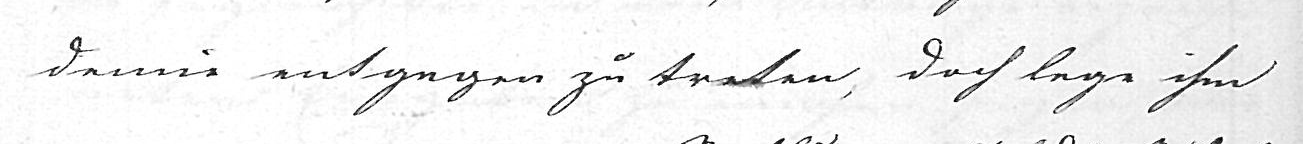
demie entgegen zu treten, doch lege ihm
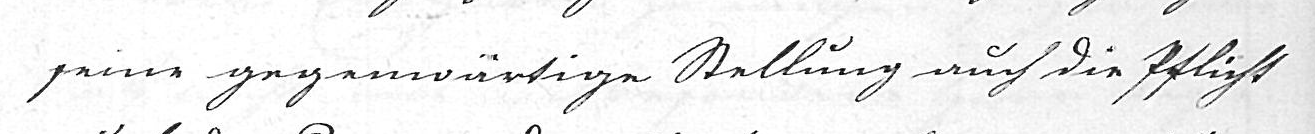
seine gegenwärtige Stellung auch die Pflicht
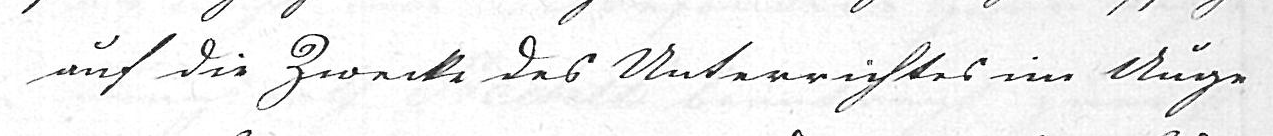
auf die Zwecke des Unterrichtes im Auge
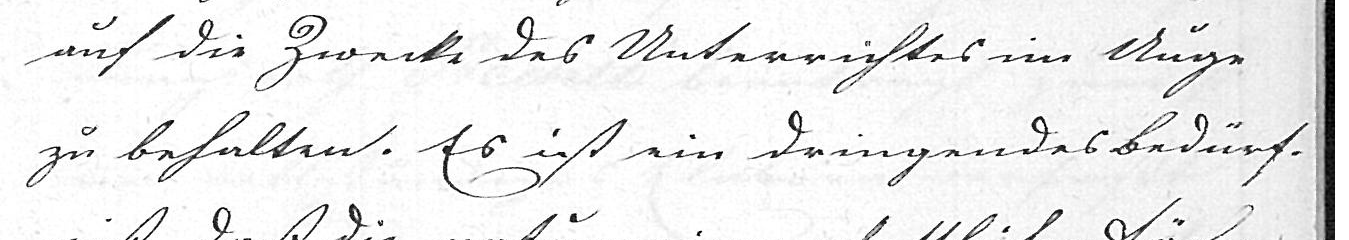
zu halten. Es ist ein dringendes Bedürf-
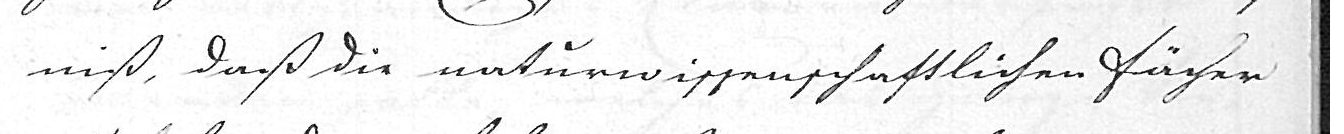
niß, daß die naturwissenschaftlichen Fächer
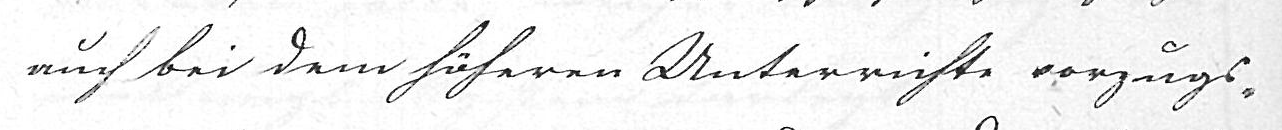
auch bei dem höheren Unterrichte vorzugs-
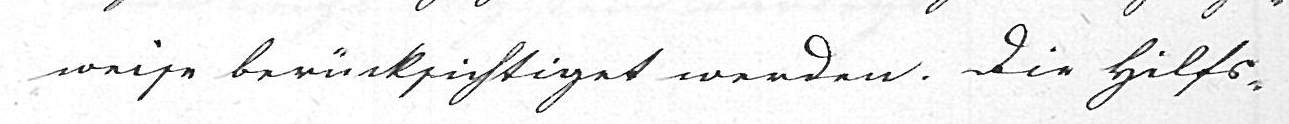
weise berücksichtiget werden. Die Hilfs-
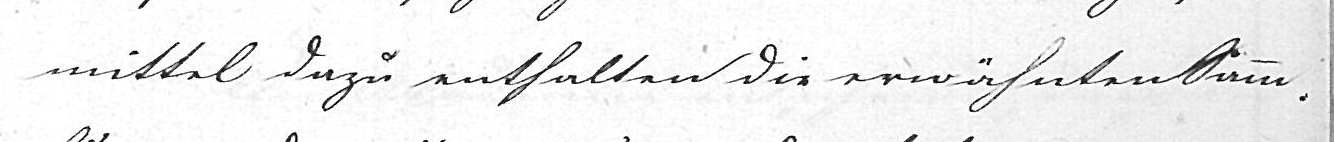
mittel dazu enthalten die erwähnten Sam-
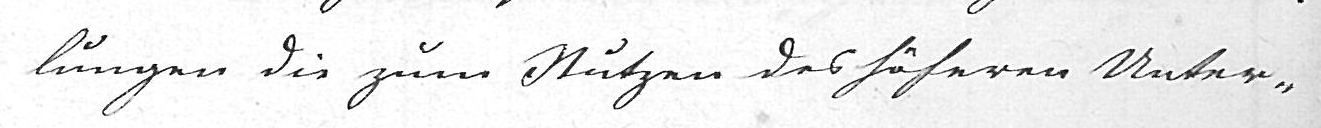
lungen die zum Nutzen des höheren Unter-
